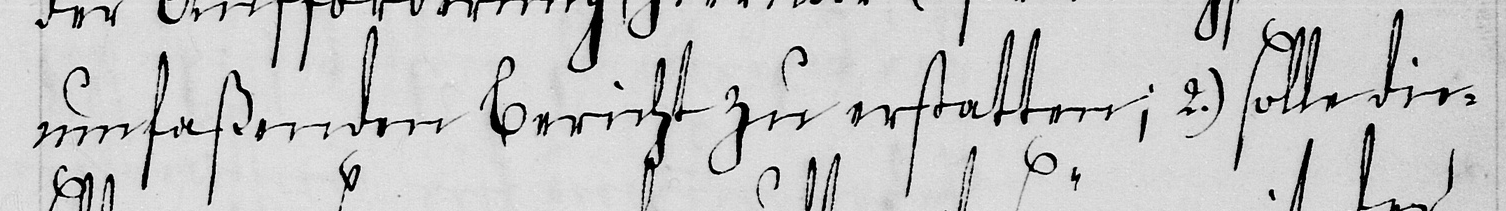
umfaßenden Bericht zu erstatten; 2.) solle die¬
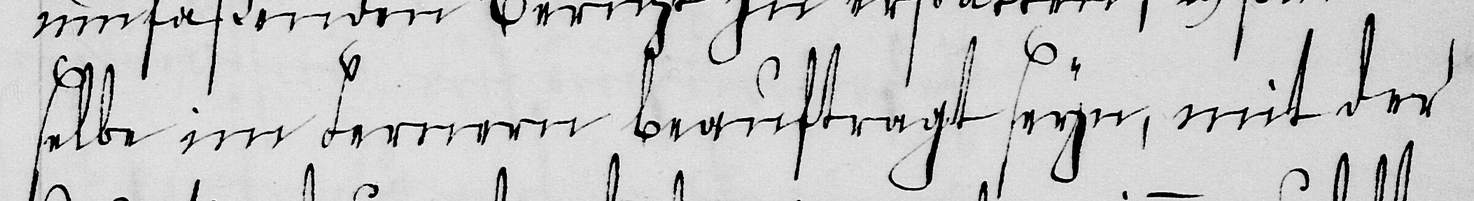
selbe im Fernern beauftragt seyn, mit der
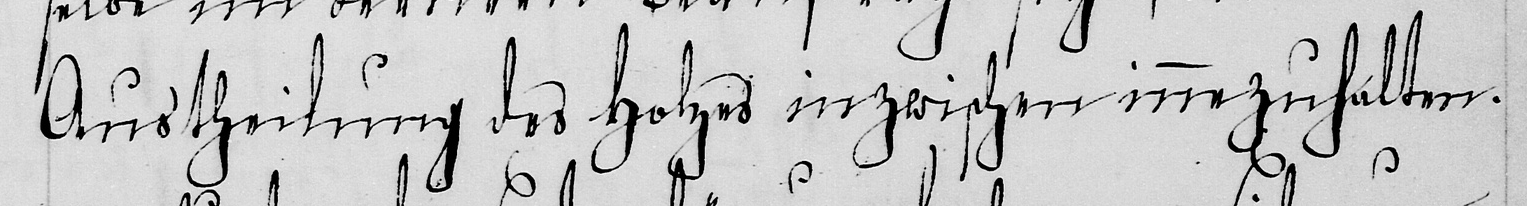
Austheilung des Holzes inzwischen innezuhalten.
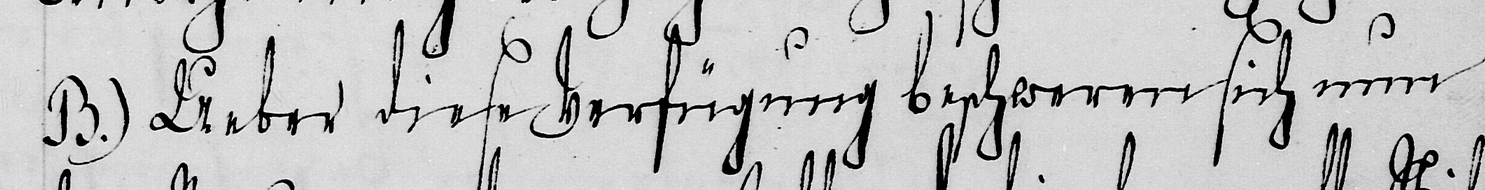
B.) Ueber diese Verfügung beschweren sich nun
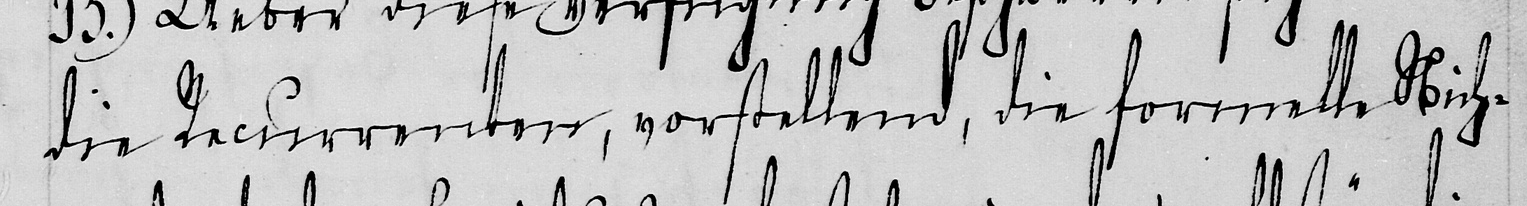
die Recurrenten, vorstellend, die formelle Nic¬
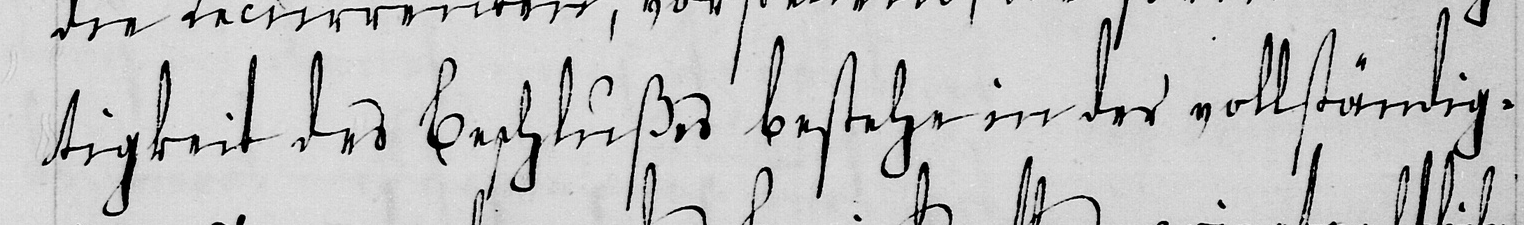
htigkeit des Beschlußes bestehe in der vollständig¬
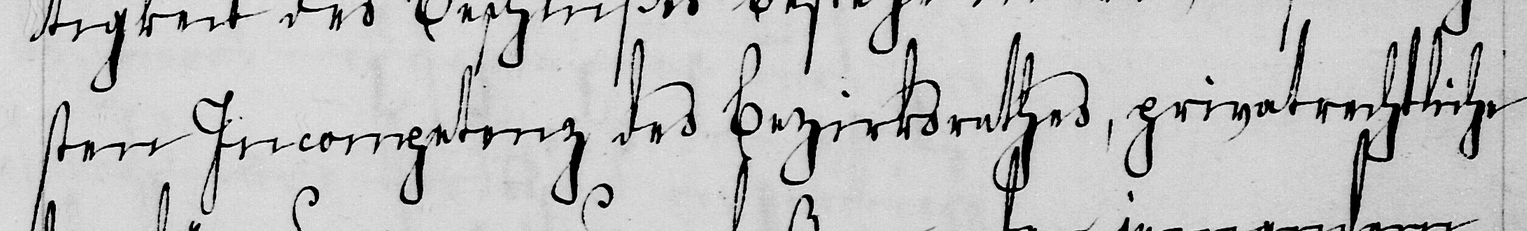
sten Incompetenz des Bezirksrathes, privatrechtliche
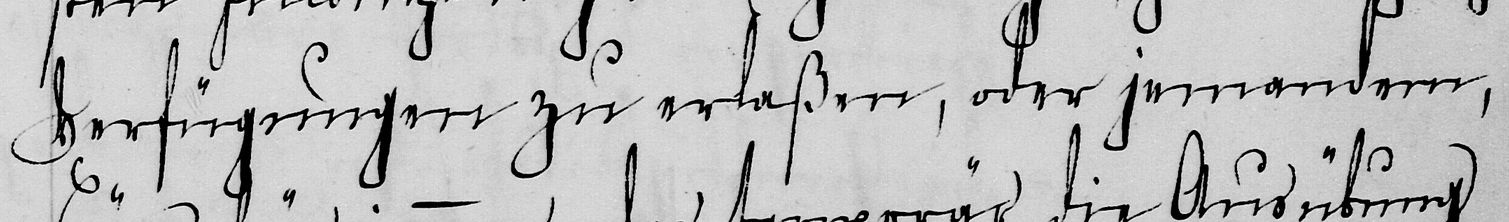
Verfügungen zu erlaßen, oder jemandem,
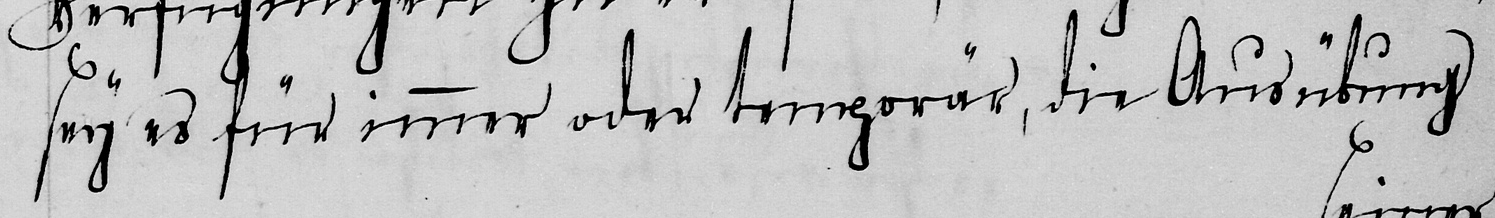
sey es für immer oder temporär, die Ausübung
